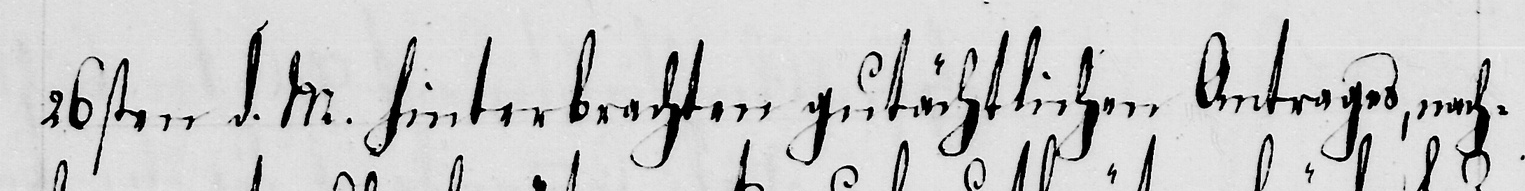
26sten d. M. hinterbrachten gutächtlichen Antrages, nac¬
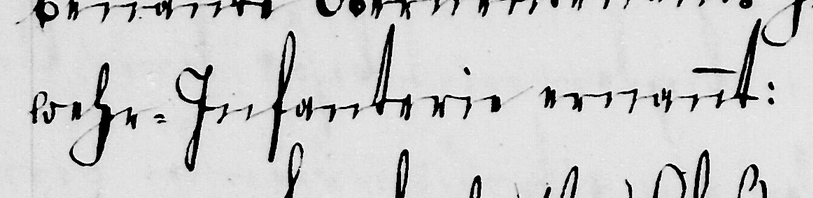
wehr-Infanterie ernannt:
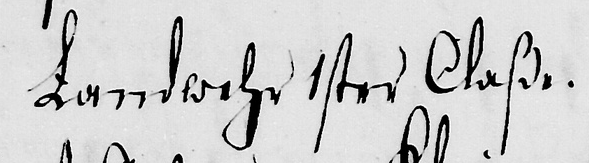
Landwehr 1ster Claße.
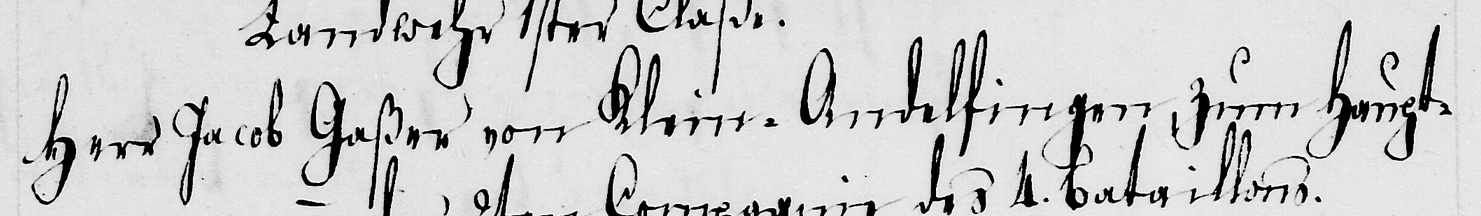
Herr Jacob Gaßer von Klein-Andelfingen zum Haupt¬
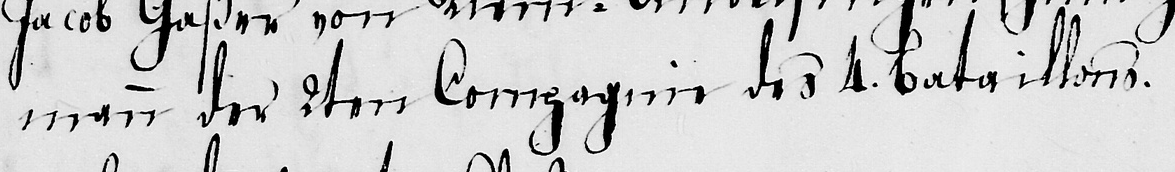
mann der 2ten Compagnie des 4. Bataillons.
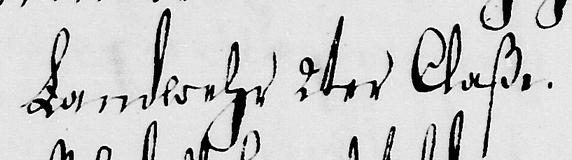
Landwehr 2ter Claße.
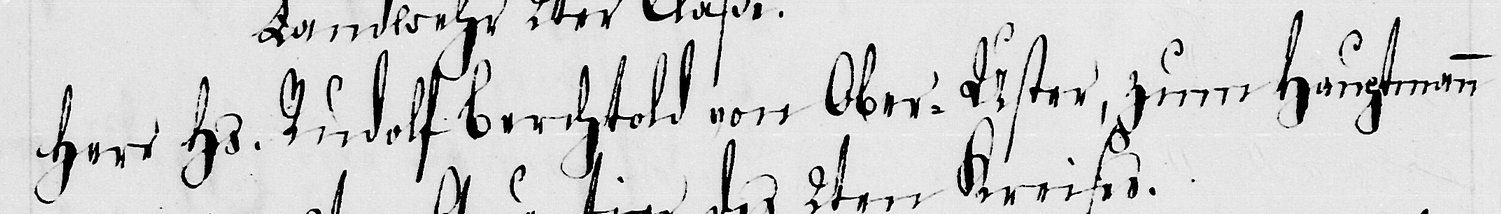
Herr Hs. Rudolf Berchtold von Ober-Uster, zum Hauptmann
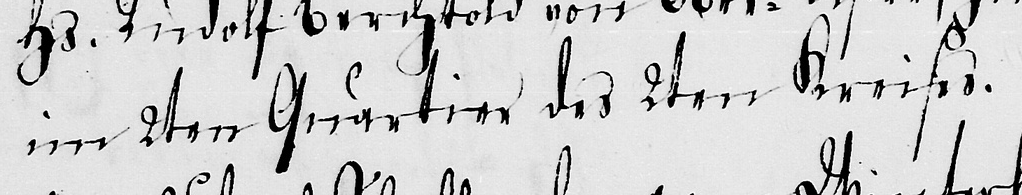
im 2ten Quartier des 2ten Kreises.
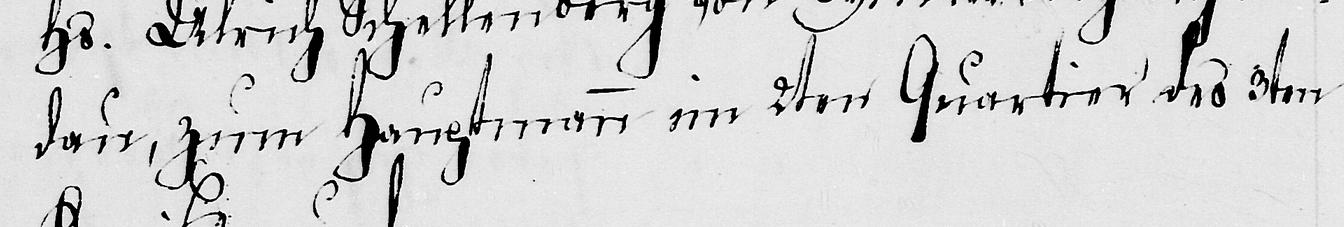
au, zum Hauptmann im 2ten Quartier des 3ten
